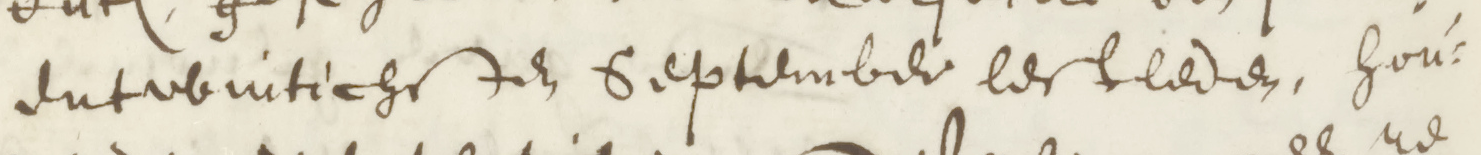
entwintichsten September lestleden, hou=
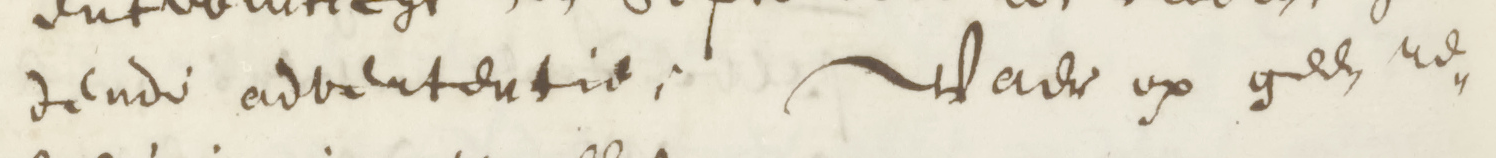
dende advertentie: Waer op geen re,,
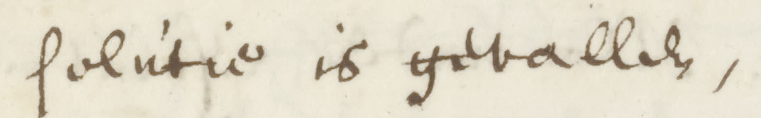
solutie is gevallen.
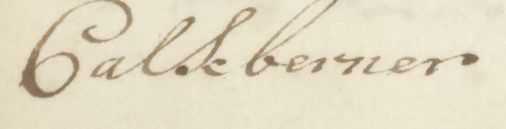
Calkberner
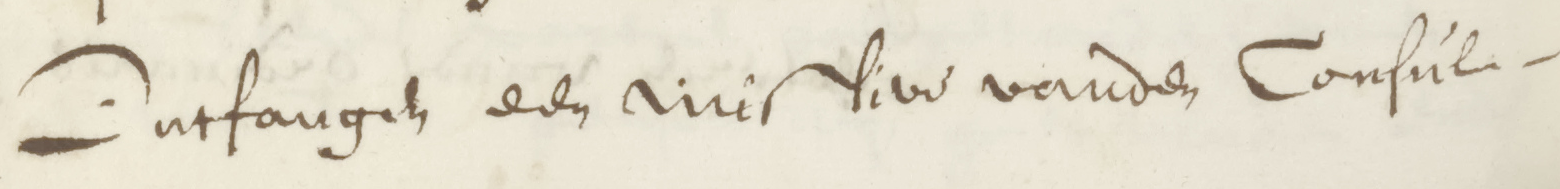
Ontfangen een missive vanden Consul —
